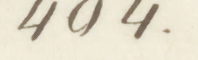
404.
